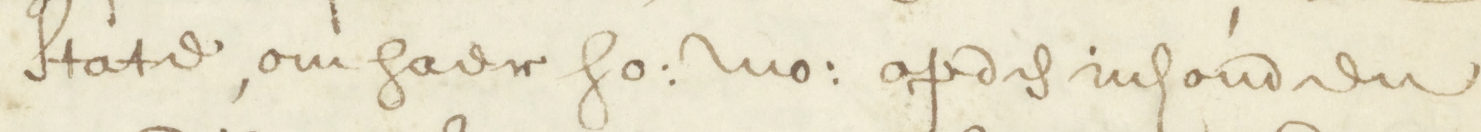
State, om haer ho:Mo: opden inhouden
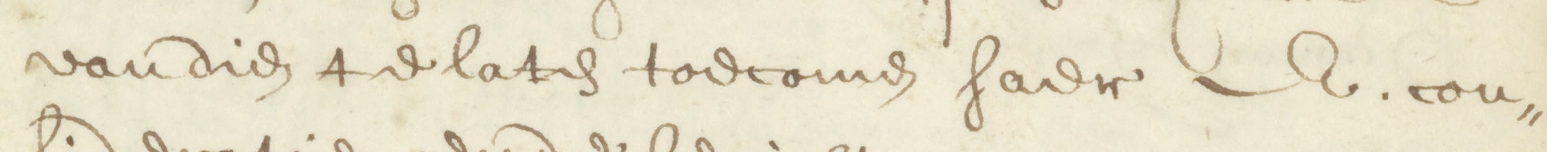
vandien te laten toecomen haer E. con„
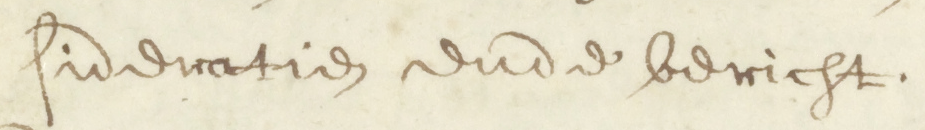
sideratien ende bericht.
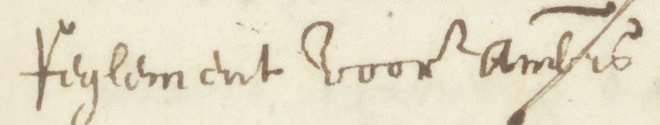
Reglement voor Ambrs
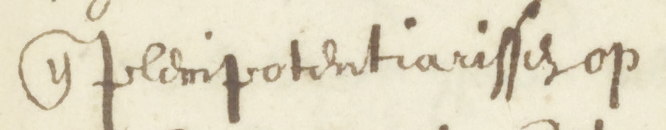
& plenipotentiarissen op
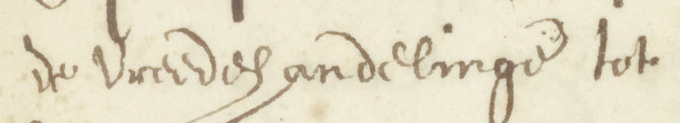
de Vreedehandelinge tot
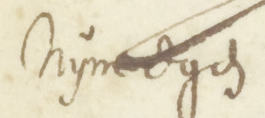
Nijmegen
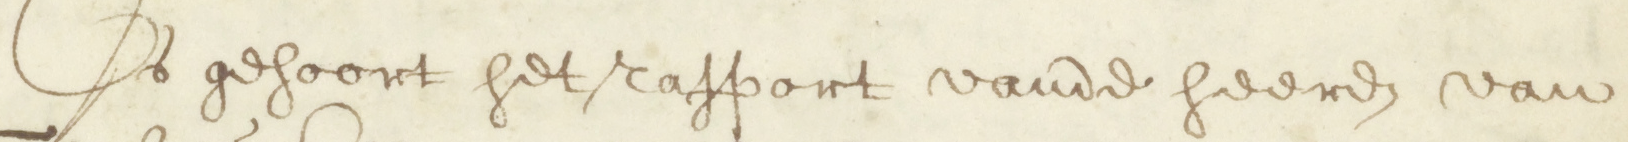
Is gehoort het rapport vande heeren van
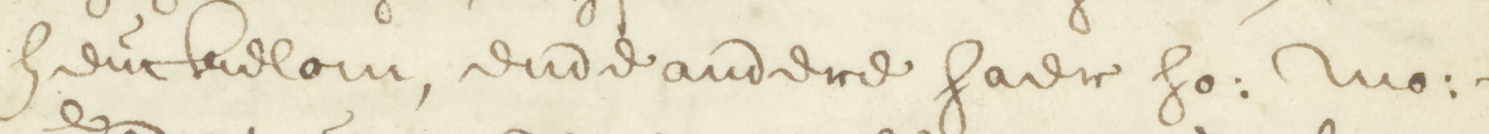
heuckelom, ende andere haer ho:Mo:
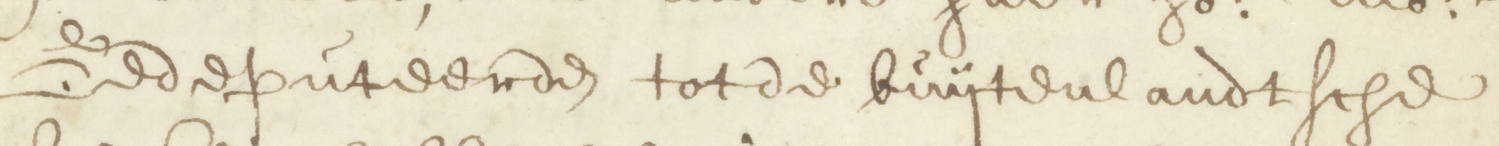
Gedeputeerden tot de buijtenlandtsche
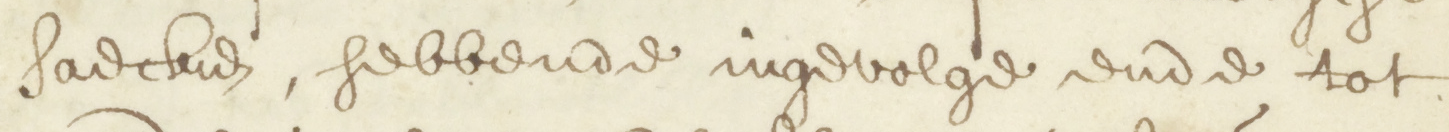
Saecken, hebbende ingevolge ende tot
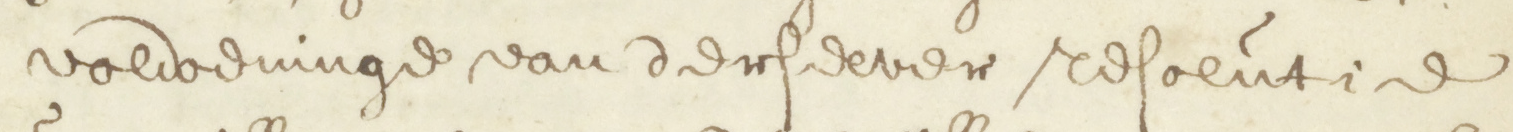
voldoeninge van derselver resolutie
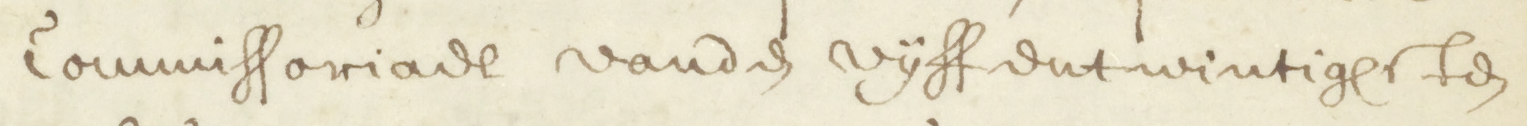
Commissoriael vanden vijffentwintighsten
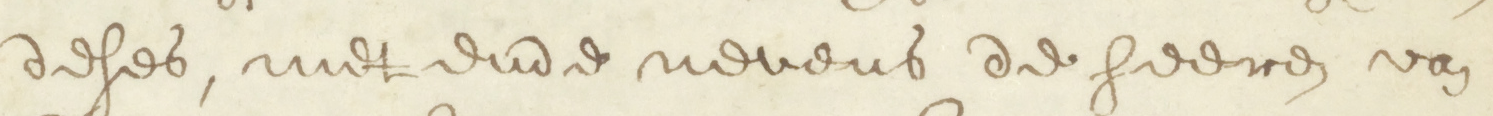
deses, met ende nevens de heeren van
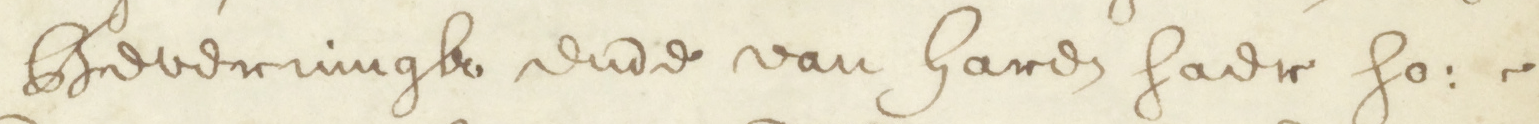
Beverningk ende van Haren haer ho:
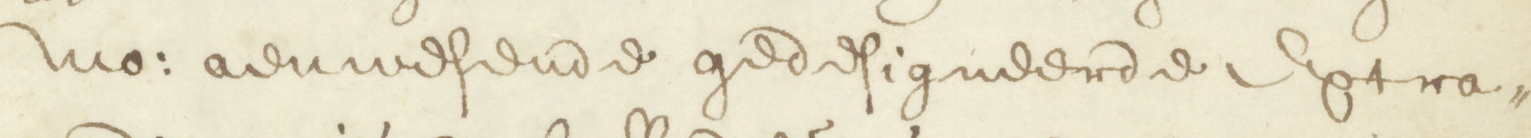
Mo: aenwesende gedesigneerde Extra„
